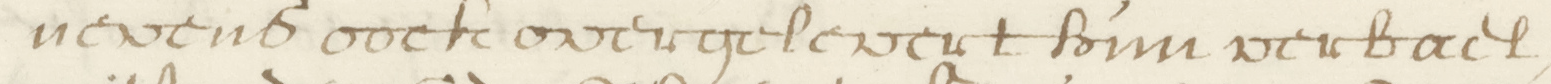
nevens oock overgelevert hun verbael
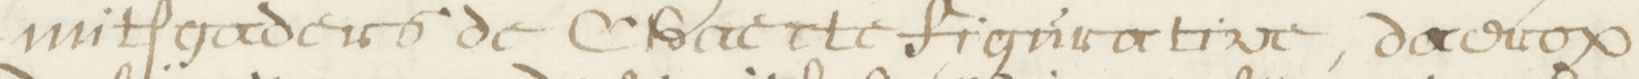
mitsgaders de Chaerte figurative, daerop
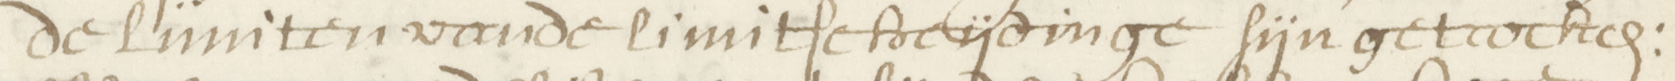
de limiten vande limitscheijdinge sijn getrocken:
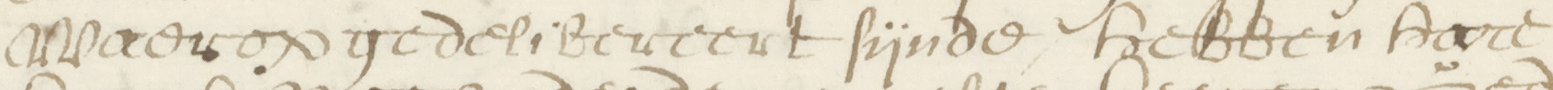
Waerop gedelibereert sijnde, hebben hare
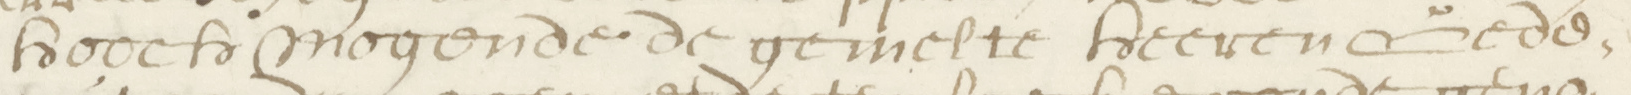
hooch mogende de gemelte heeren Gede,,
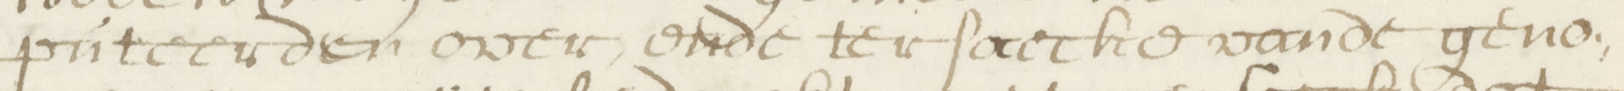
puteerden over, ende ter saecke vande geno,,
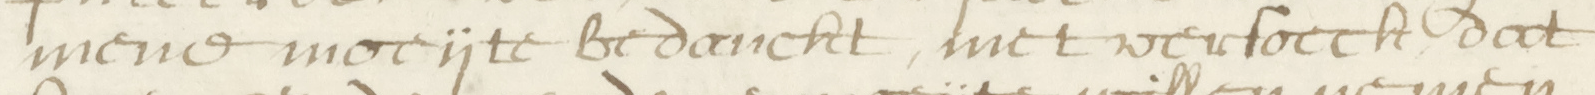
mene moeijte bedanckt, met versoeck, dat
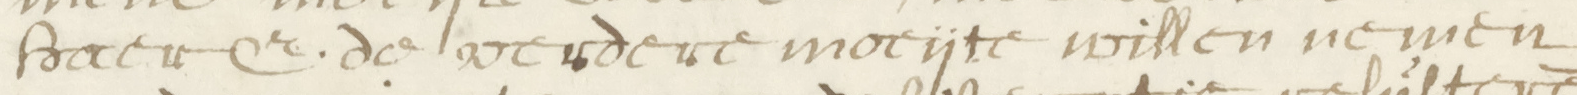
haer E. de verdere moeijte willen nemen,
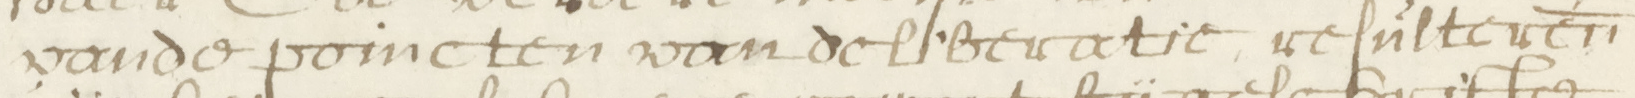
vande poincten van deliberatie resulteren
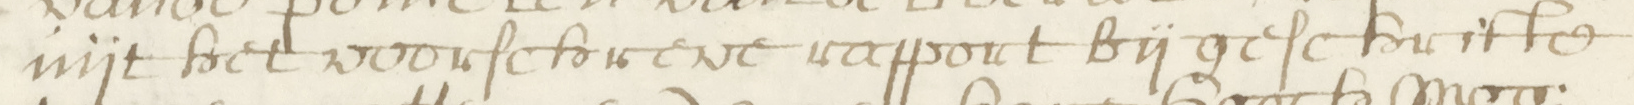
uijt het voorschreve rapport bij geschrifte
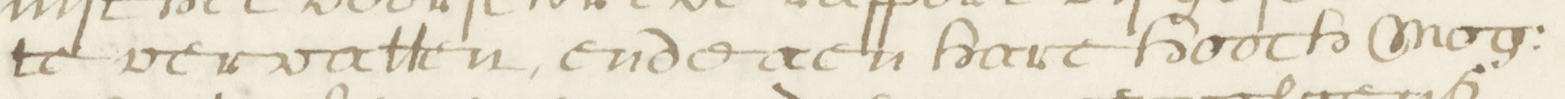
te vervatten, ende aen hare hooch mog:
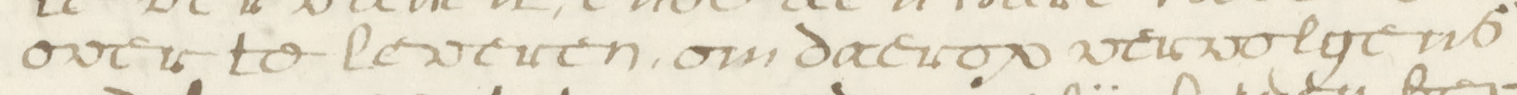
over te leveren, om daerop vervolgens
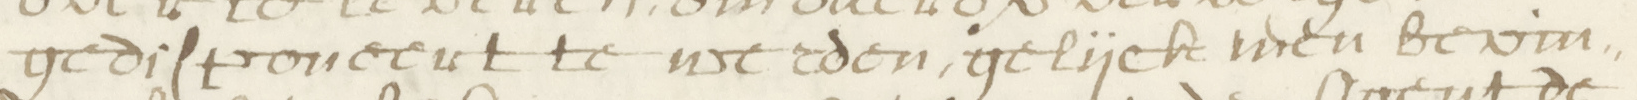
gedisponeert te werden, gelijck men bevin,,
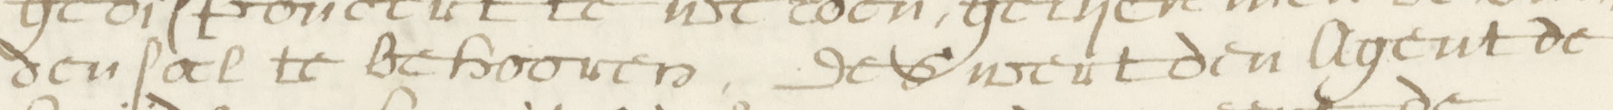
den sal te behooren. Des wert den Agent de
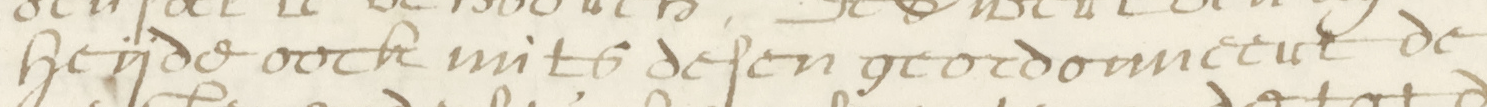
heijde oock mits desen geordonneert de
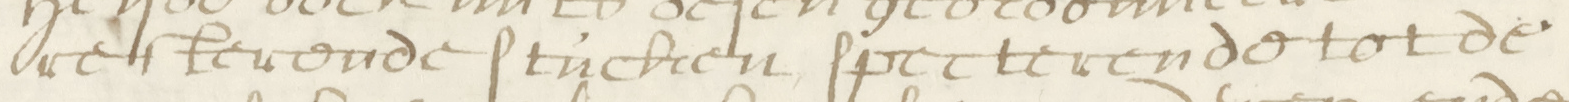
resterende stucken specterende tot de
